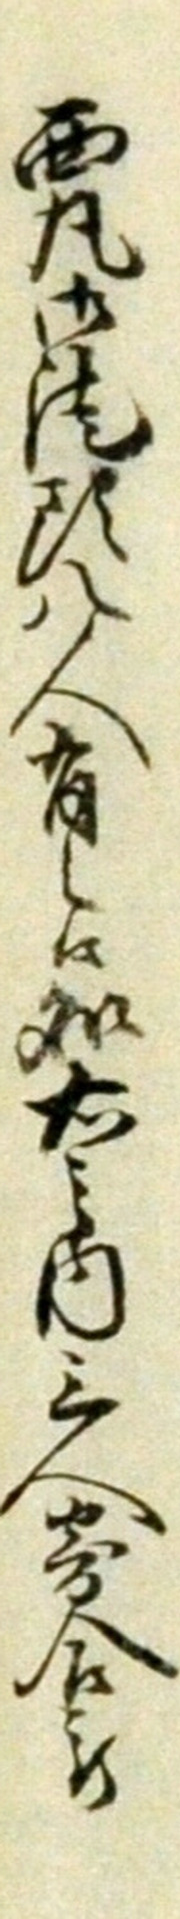西丸御徒頭八人有之候処右之内三人寄合被
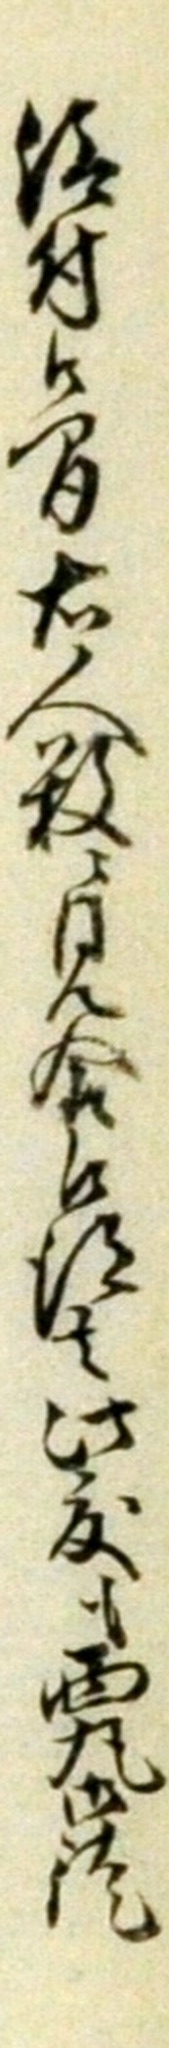仰付候間右人数ニ見合候得者此度も西丸御徒
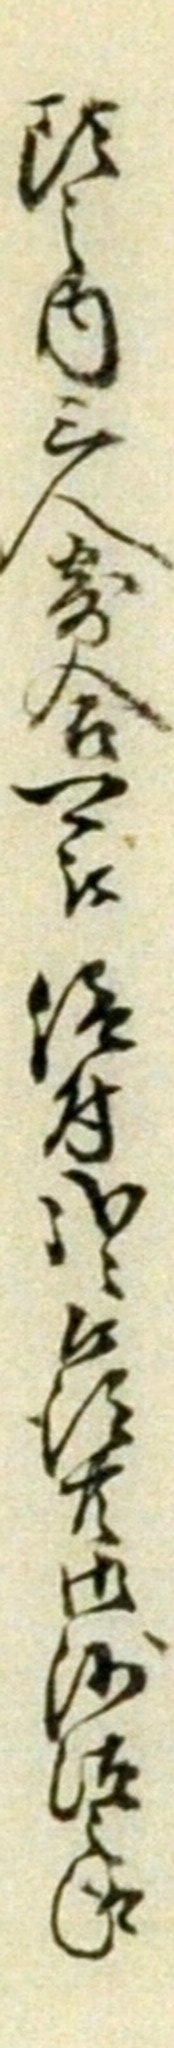頭之内三人寄合可被仰付哉ニ候得共御沙汰之趣
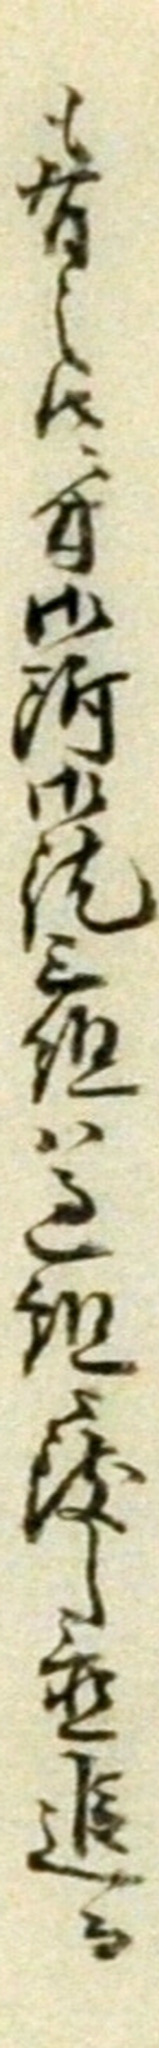も有之候ニ付御附御徒三組は過組ニ致し置追而
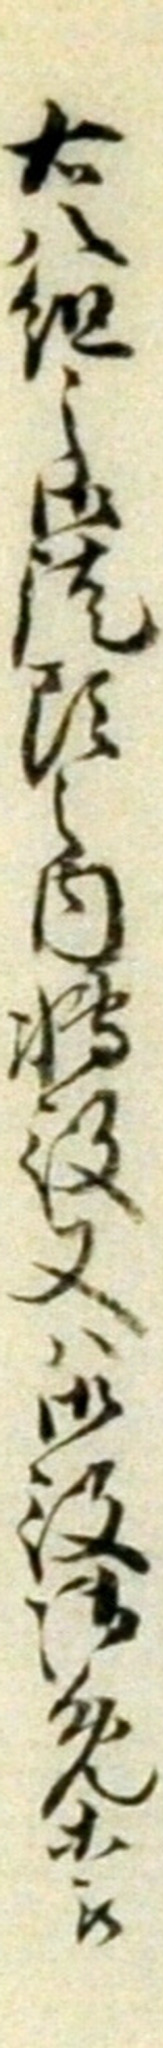右八組之御徒頭ノ内轉役又ハ御役御免等被
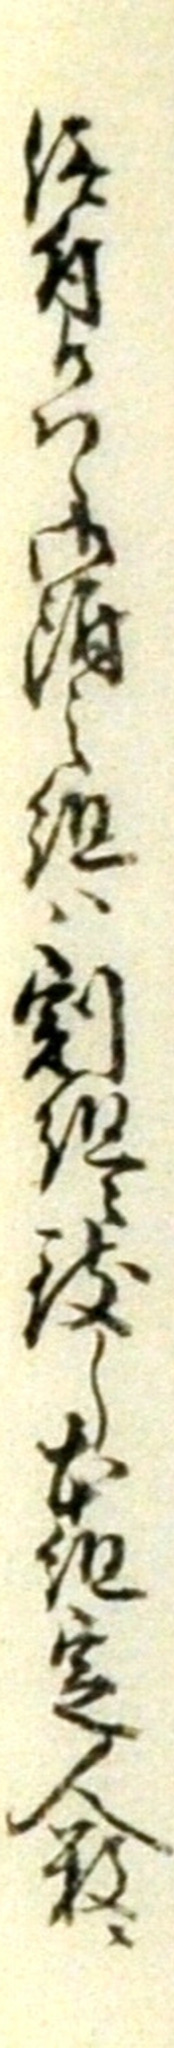仰付候ハゝ御附之組ハ割組ニ致し本組定人数ニ

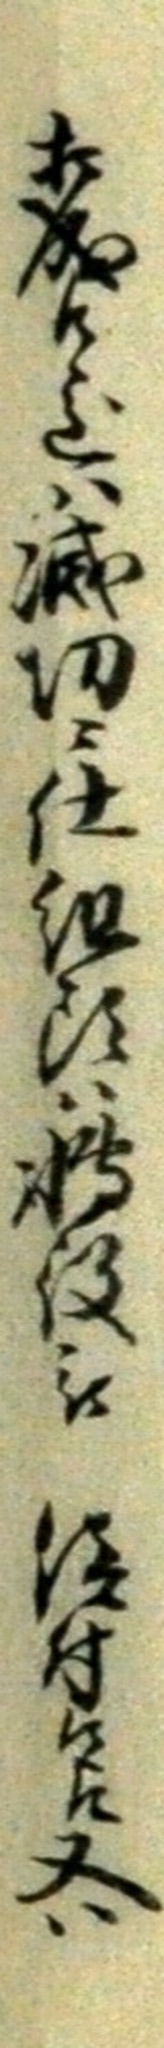相成候迄ハ滅切ニ仕組頭ハ転役被仰付候者又ハ
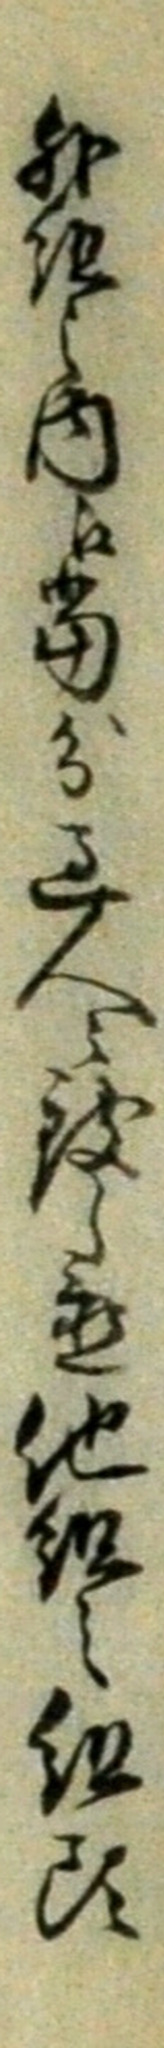外組之内江当分過人ニ致シ置他組之組頭
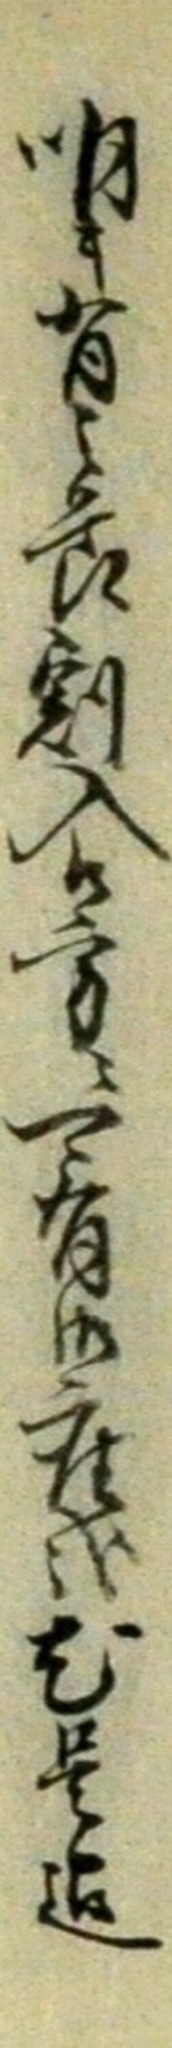明キ有之節割入候方ニ可有御座哉尤是迄
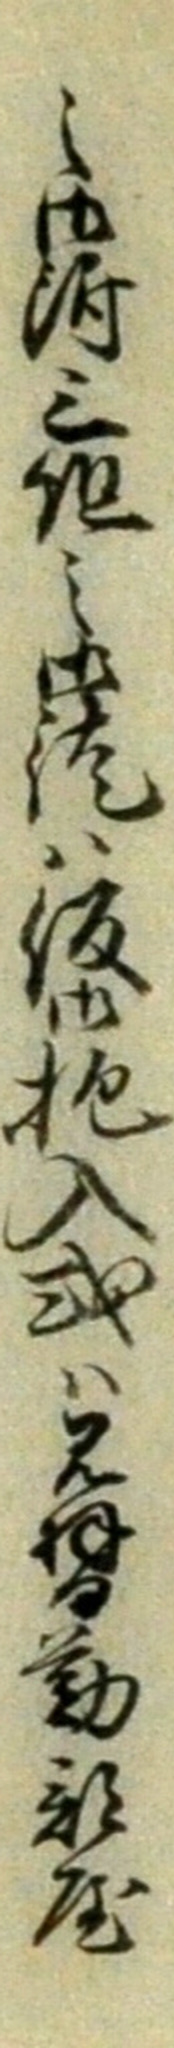之御附三組之御徒ハ仮御抱入或ハ見習勤部屋
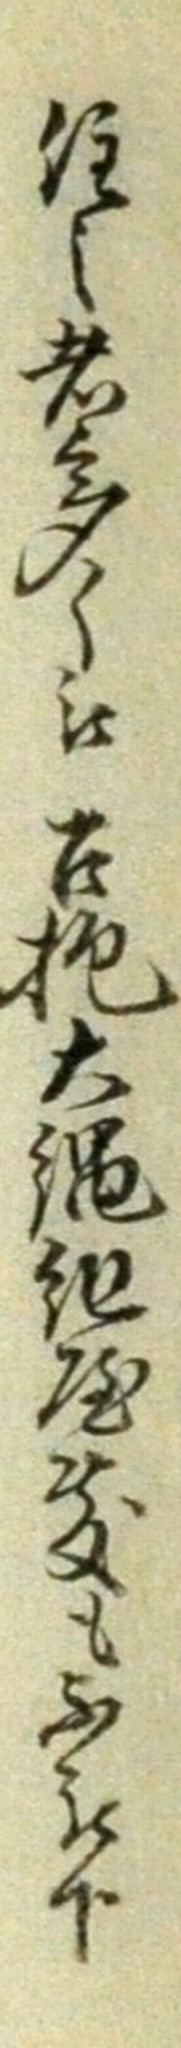住之者多く被召抱大繩組屋敷も不被下
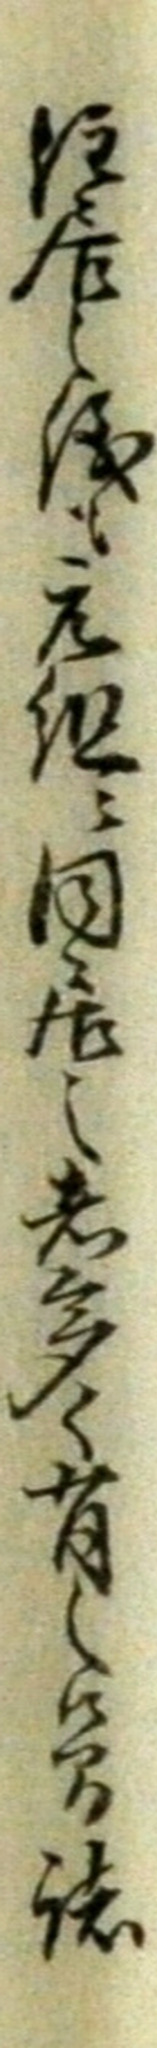住居之儀も元組ニ同居之者多く有之候間諸
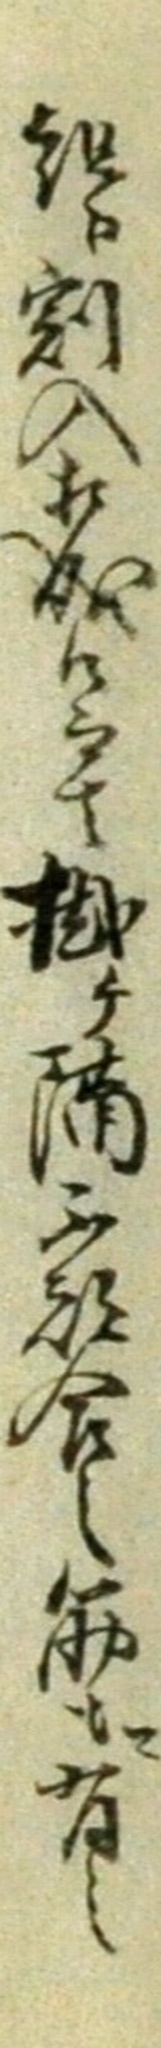組江割入相成候而者掛ケ鋪不都合之筋も可有之
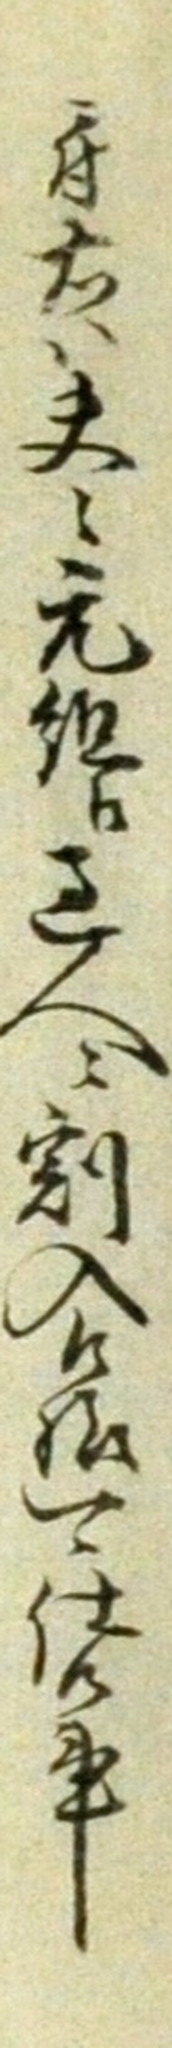ニ付右ハ夫々元組江過人ニ割入候様可仕候事
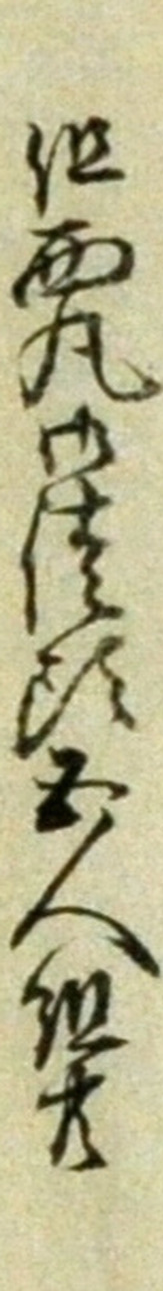但西丸御徒頭五人組共
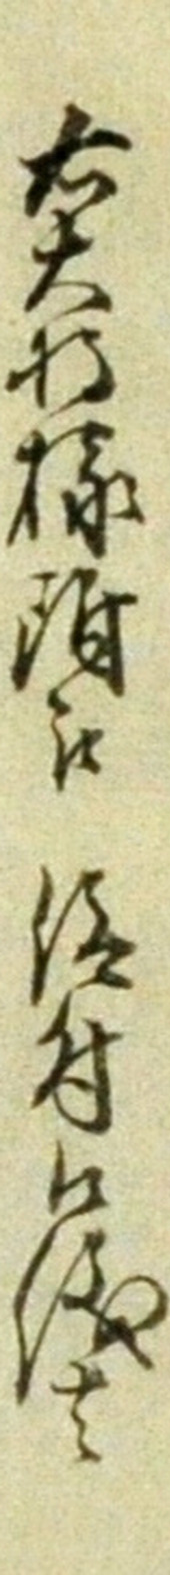右大将様附被仰付候儀者
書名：若年寄御役中御調書付
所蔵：伊那市立高遠町図書館・合同会社AMANE
